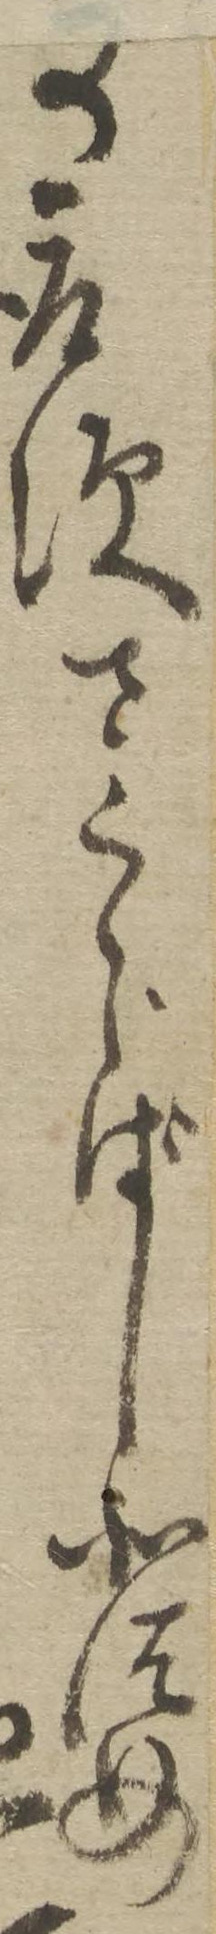又取次さくらばし北つめ近
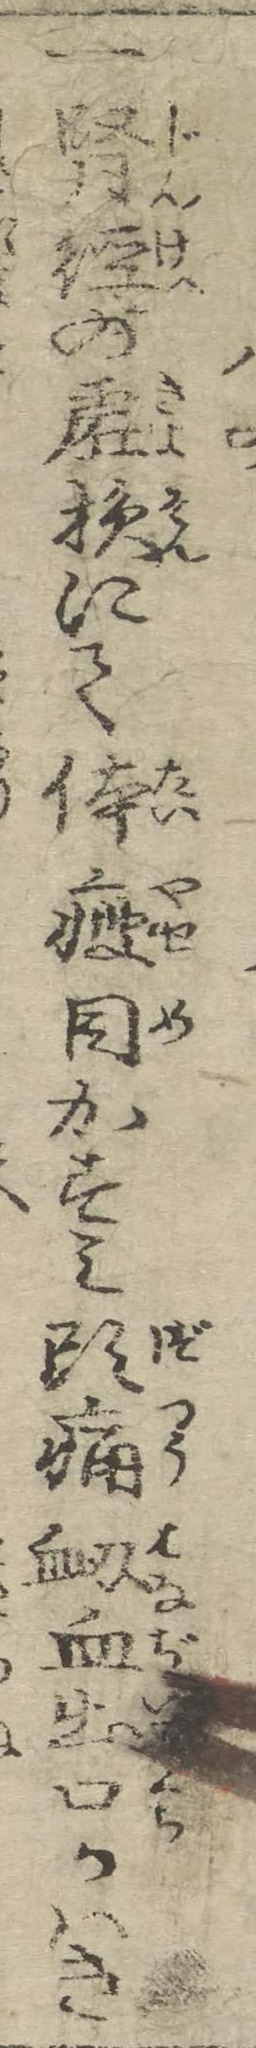一腎径の虚損にて体痩目かすみ頭痛衂血出口かはき
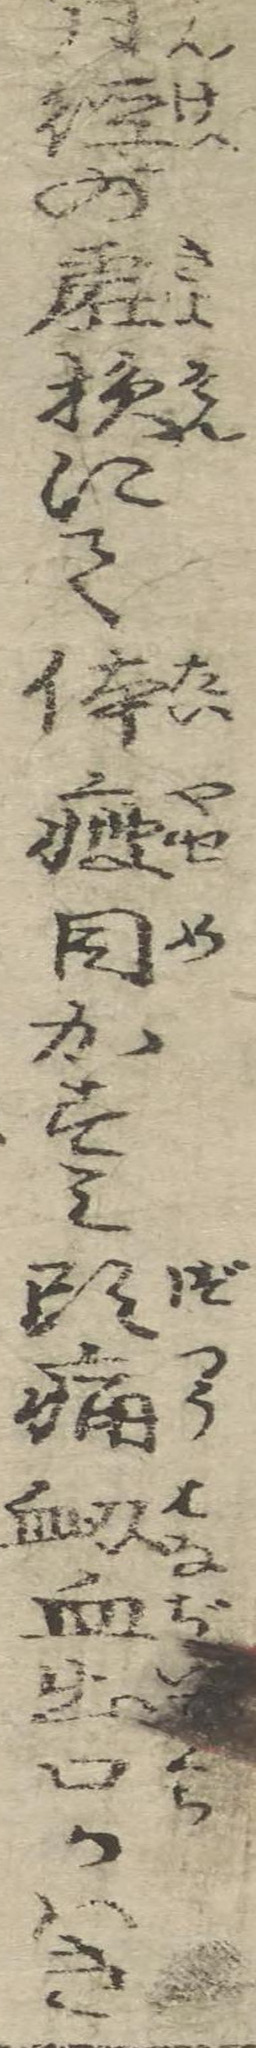一腎径の虚損にて体痩目かすみ頭痛衂血出口かはき
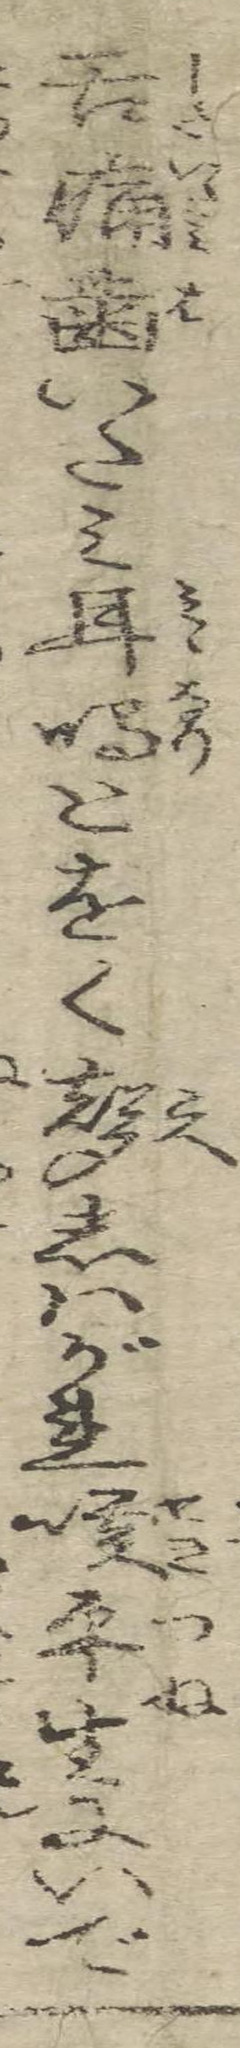舌痛歯いたみ耳鳴とをく声しはがれ咳平生にいで
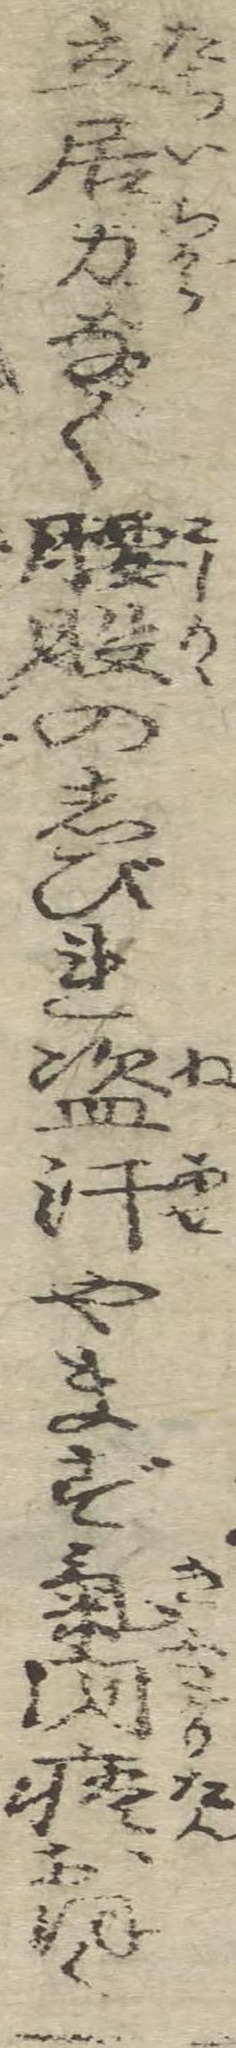立居力なく腰股のしびれ盗汗やまず気閉痰おほく
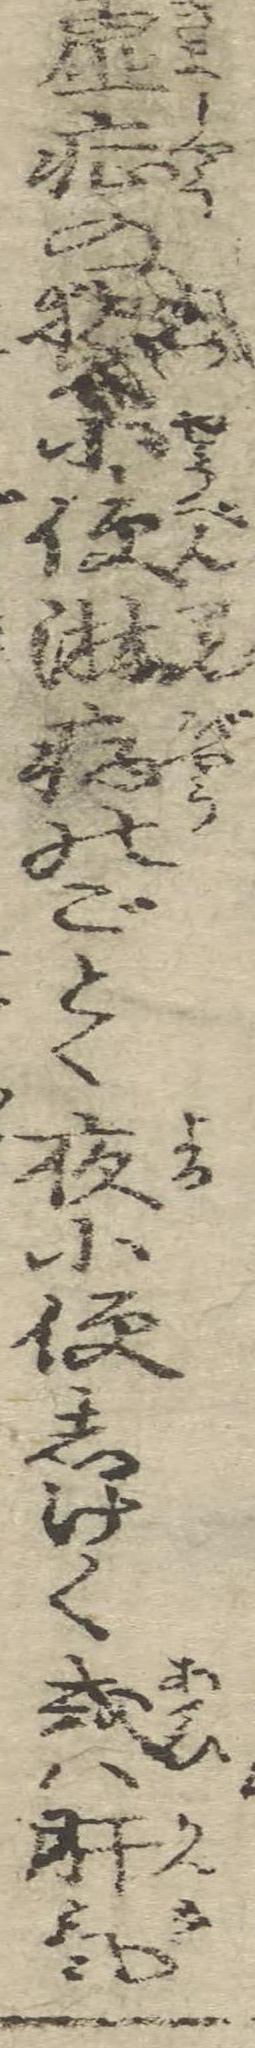虚症のや小便淋病のごとく夜小便しけく或は肝気
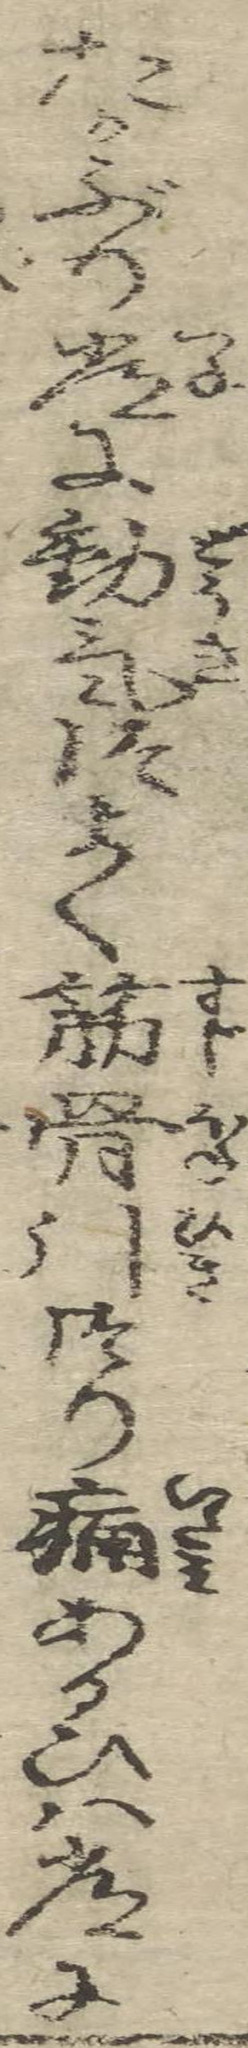たかぶり常に動気つよく筋骨引つり痛あるひは常に
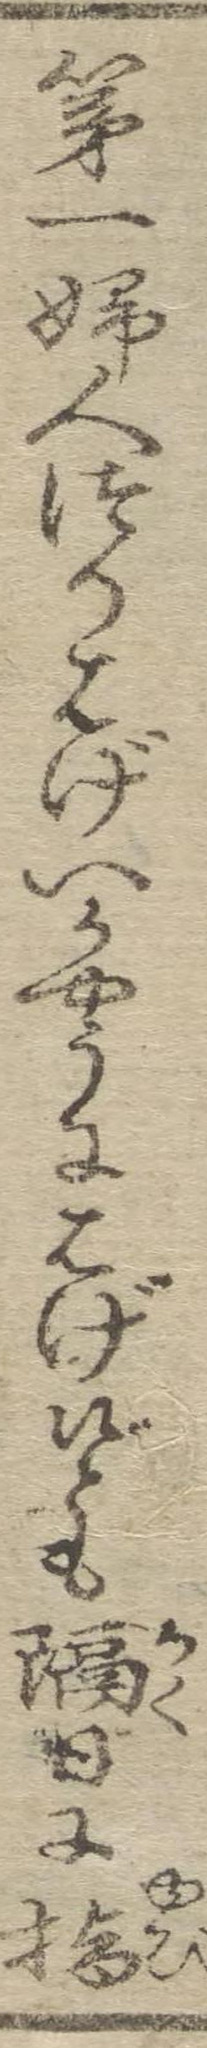第一婦人つりはげいかやうにはげ候とも隔日に指
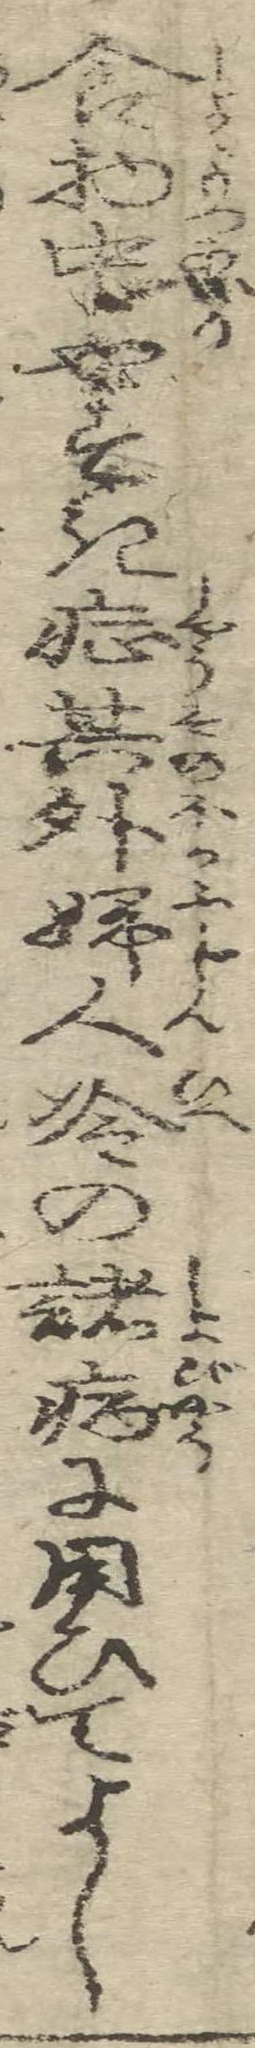食物中やすき症其外婦人冷の諸病に用ひてよし
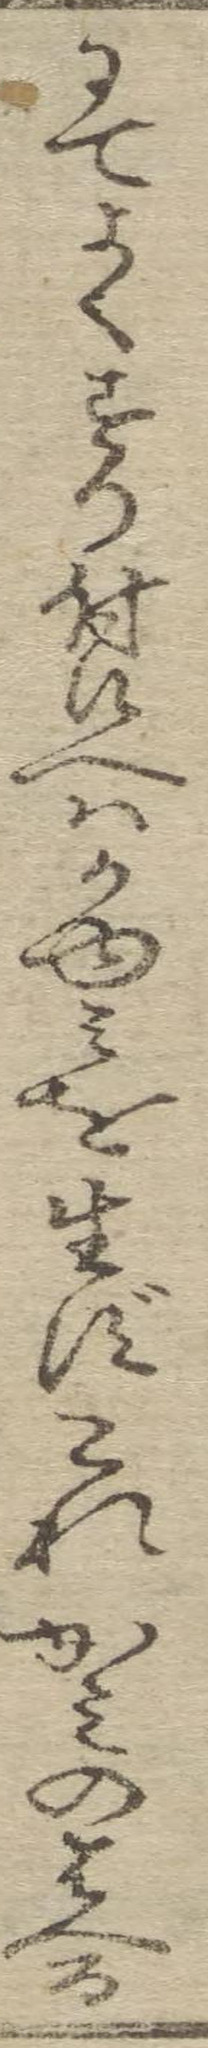にてよくすり付候へはかゆみを生ずこれかみのはへる
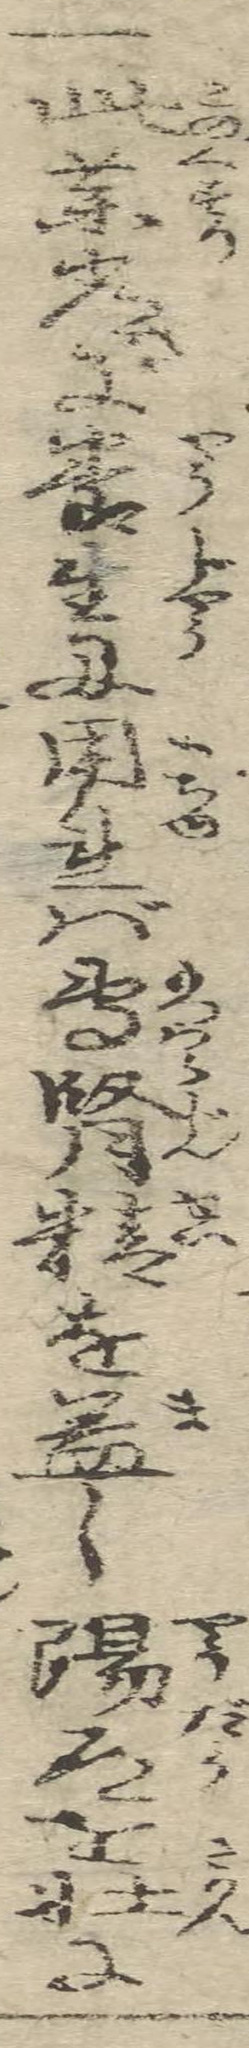一此薬常に養生に用れば専腎精を益し陽道を壮に
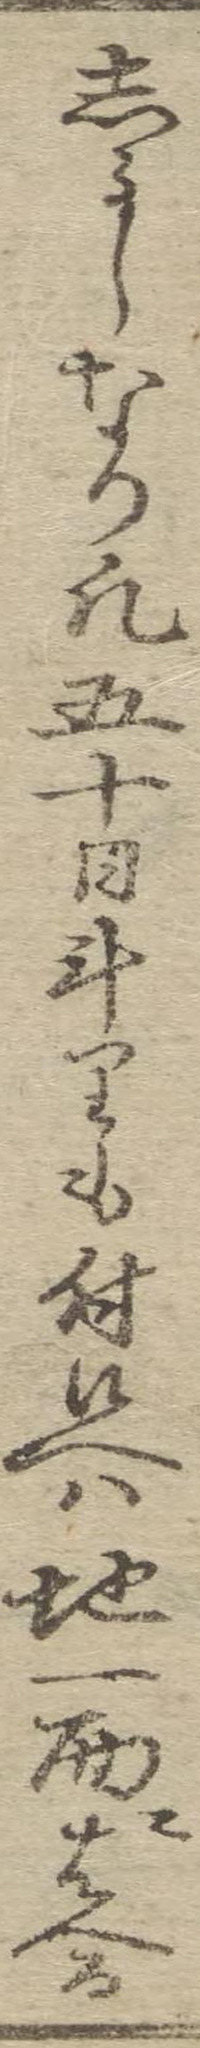しるしなり凢五十日斗りも付候へは地一面にはえる
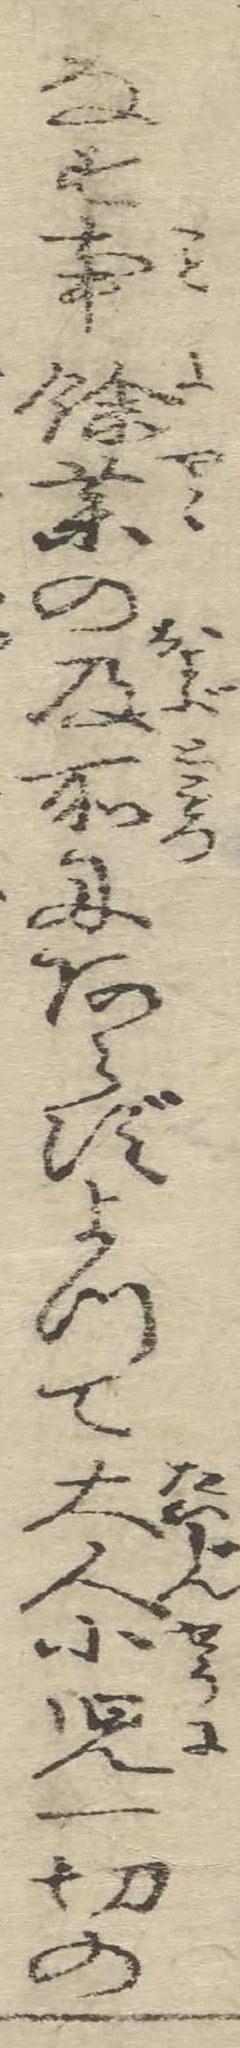なす事余薬の及所にあらずよつて大人小児一切の
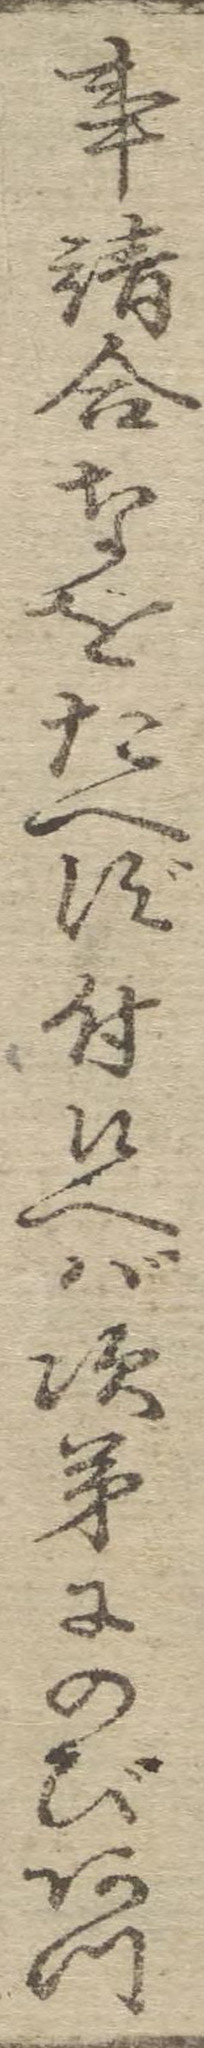事請合なをたへず付候へば次第にのびあつ
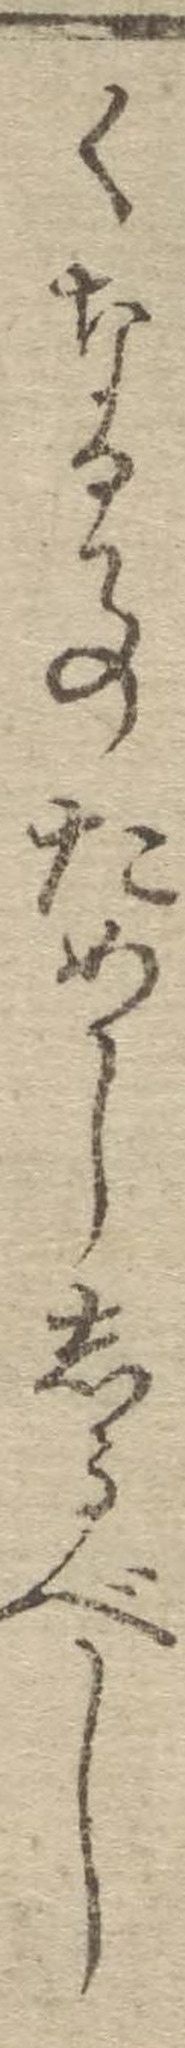くなる事ためししるべし
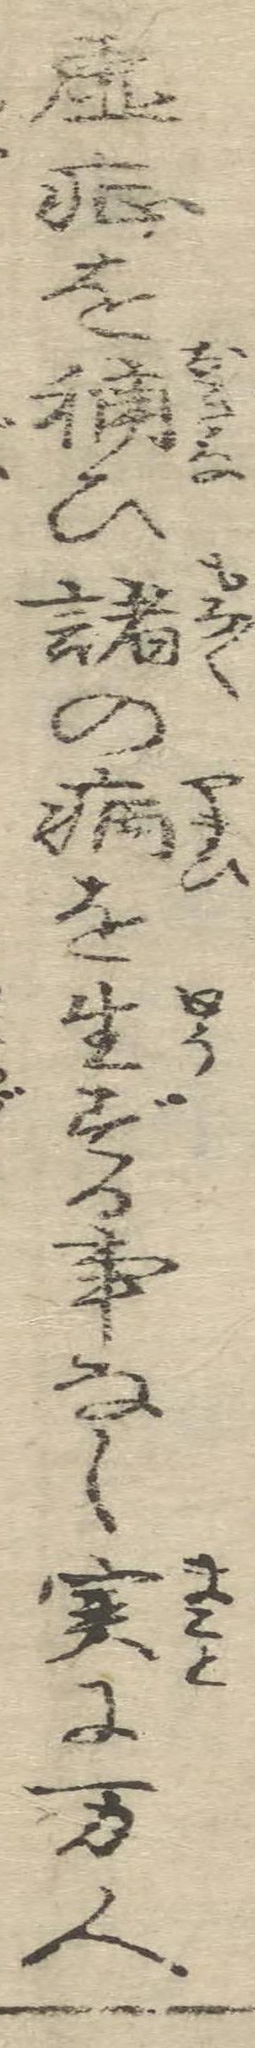虚症を補ひ諸の病を生ずる事なし実に万人
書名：浪華薬種問屋能書張交帖. 二
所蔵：国立国会図書館 National Diet Library, JAPAN
